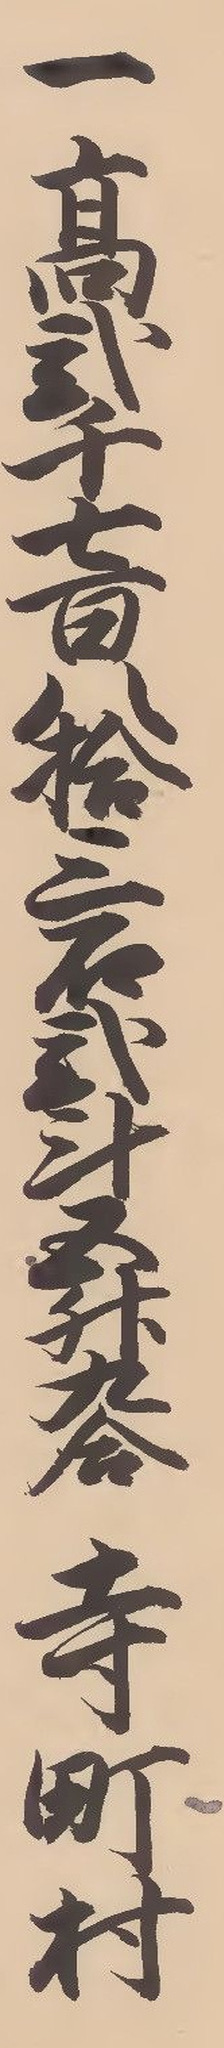一高弐千七百八拾三石弐斗五升九合寺町村
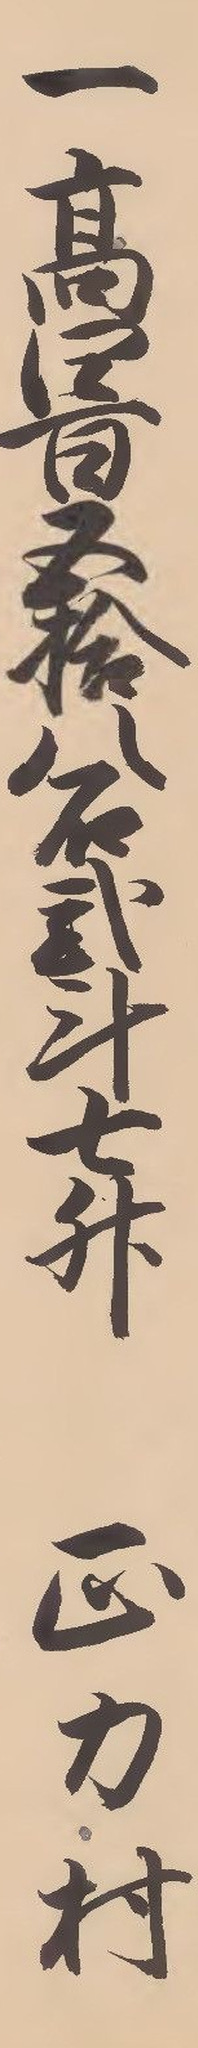一高四百五拾八石弐斗七升正力村
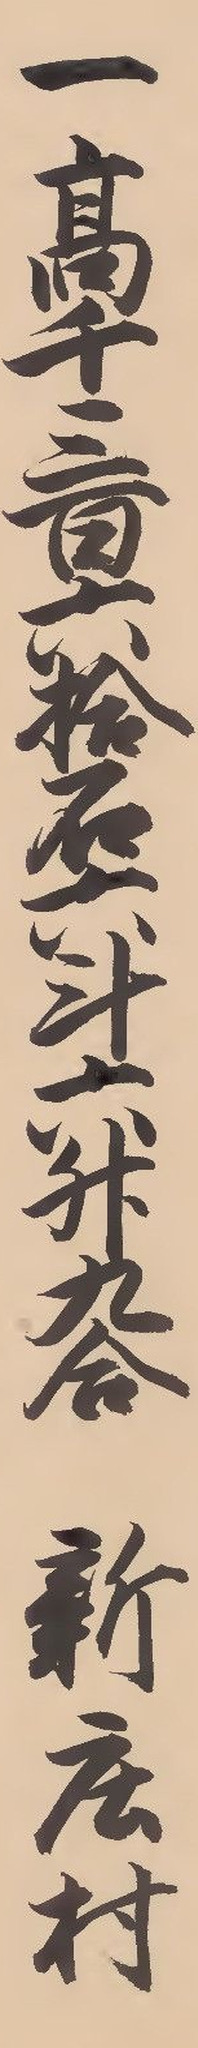一高千三百六拾石六斗六升九合新庄村
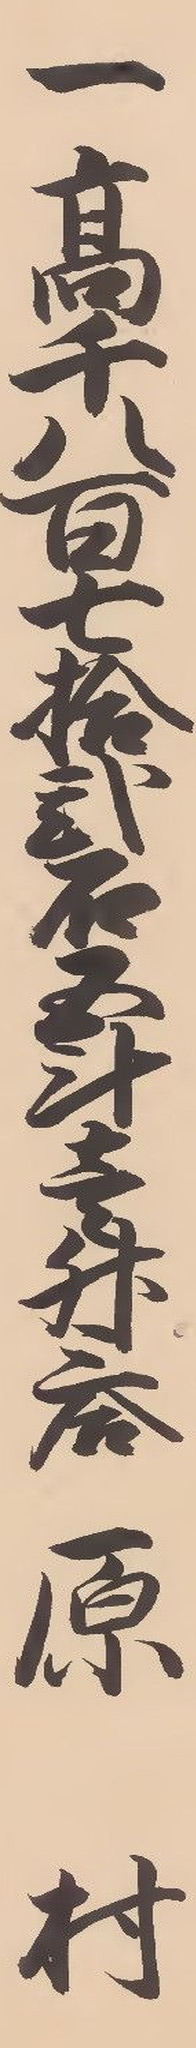一高千八百七拾弐石五斗壱升三合原村
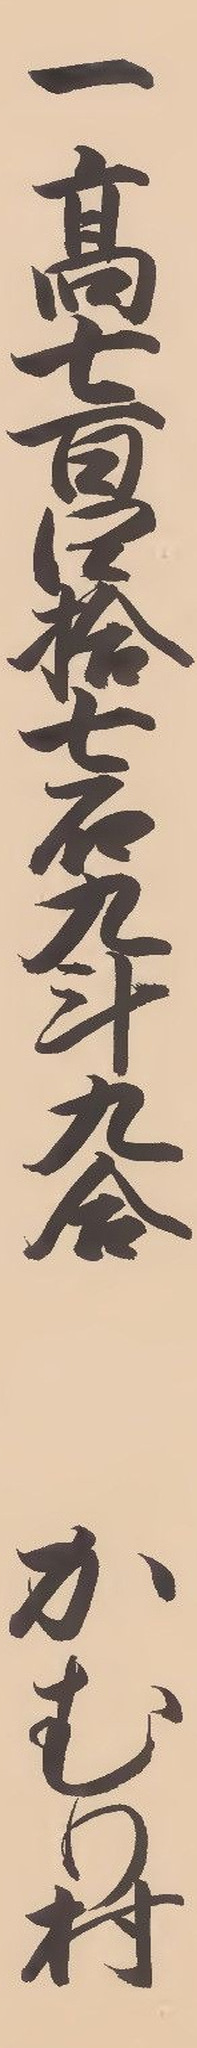一高七百四拾七石九斗九合かむり村
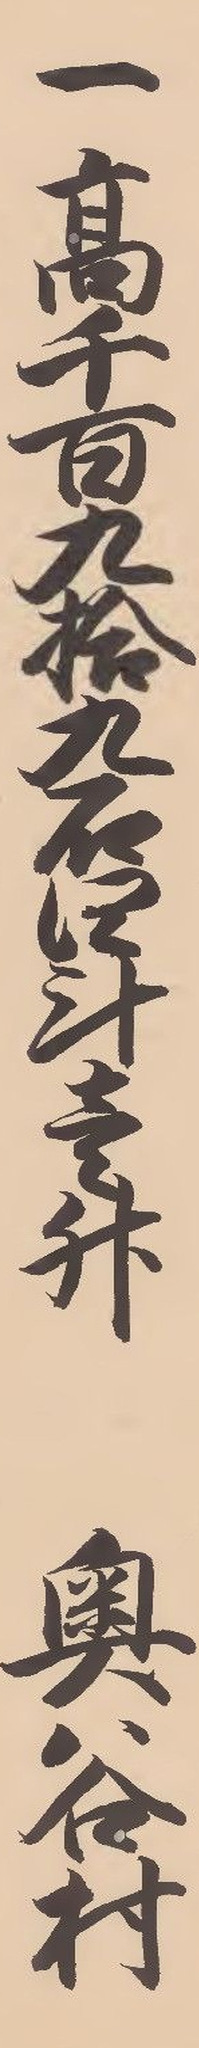一高千百九拾九石四斗壱升奥谷村
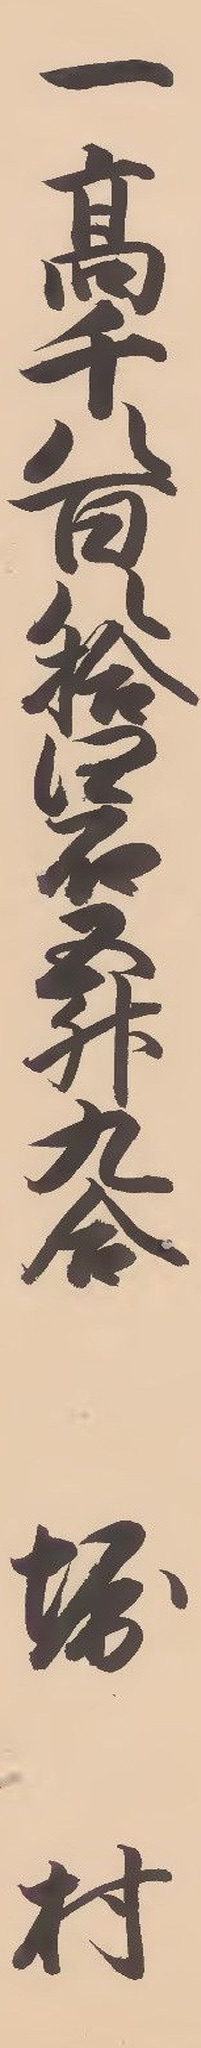一高千八百八拾四石五升九合堀村

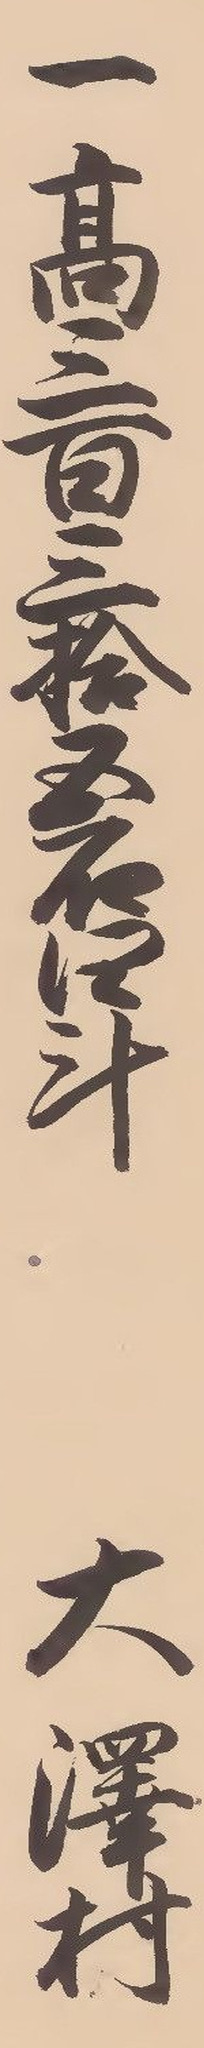一高三百三拾五石四斗大沢村
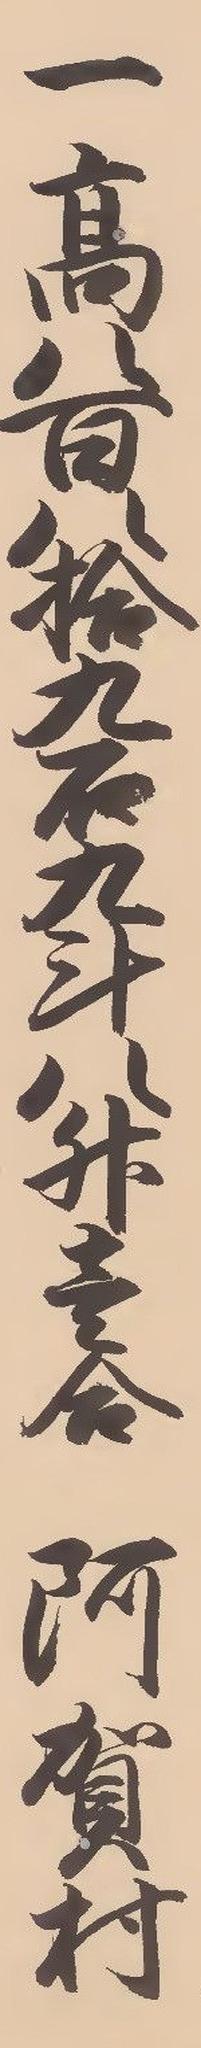一高八百八拾九石九斗八升壱合阿賀村
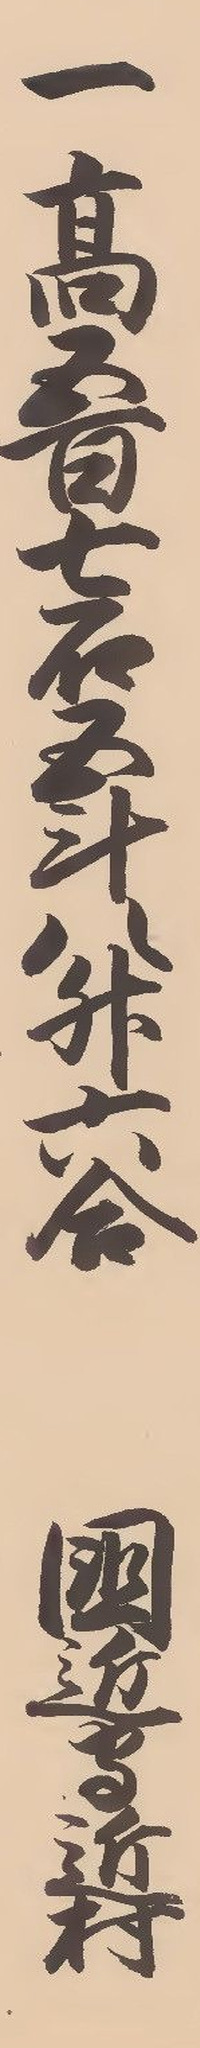一高五百七石五斗八升六合国近守近村
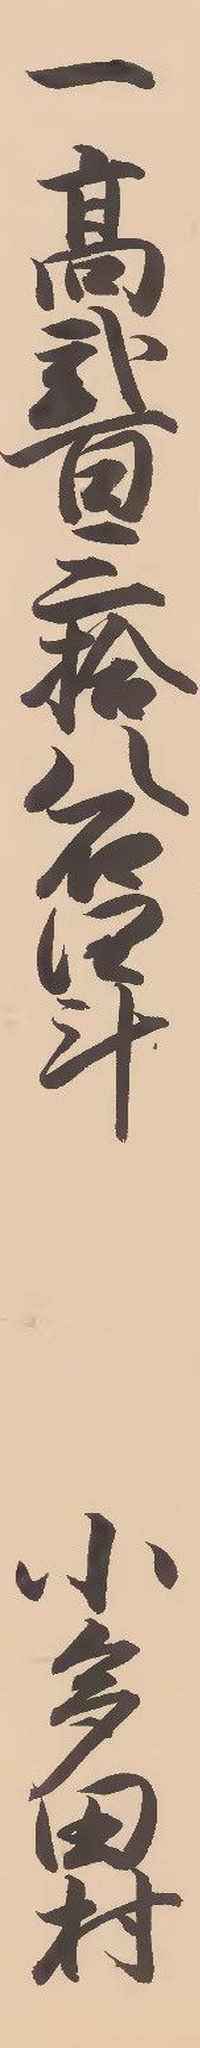一高弐百三拾八石四斗小多田村
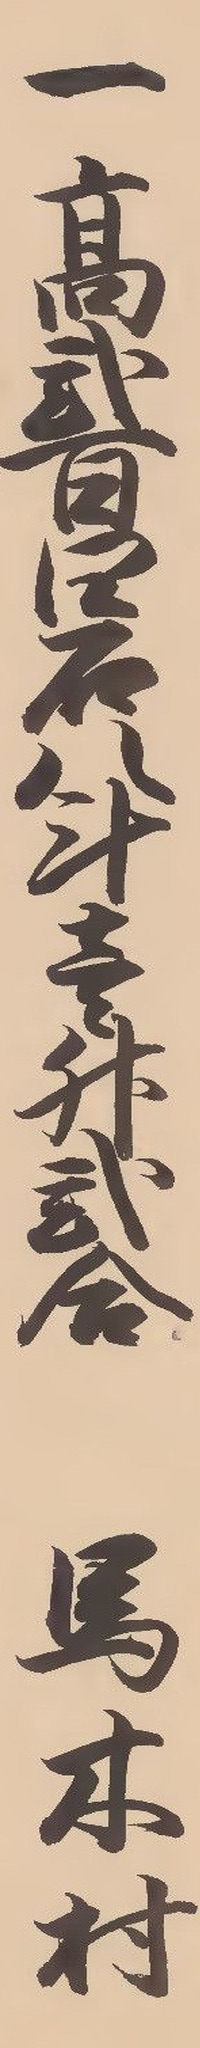一高弐百四石八斗壱升弐合馬木村
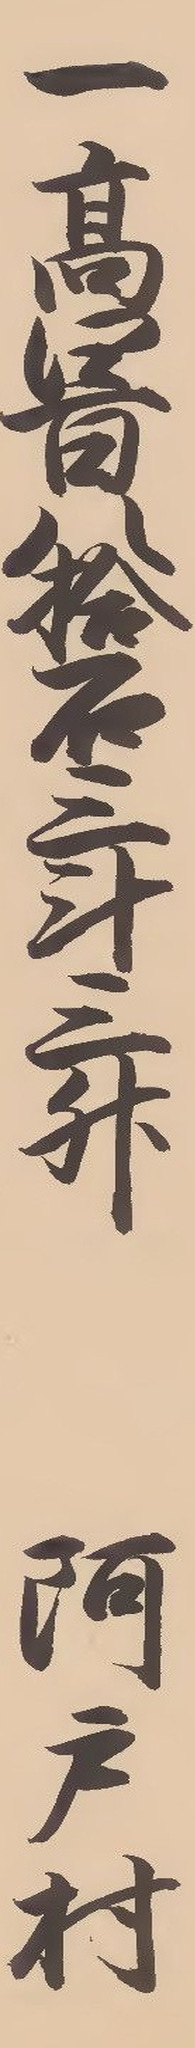一高四百八拾石三斗三升阿戸村
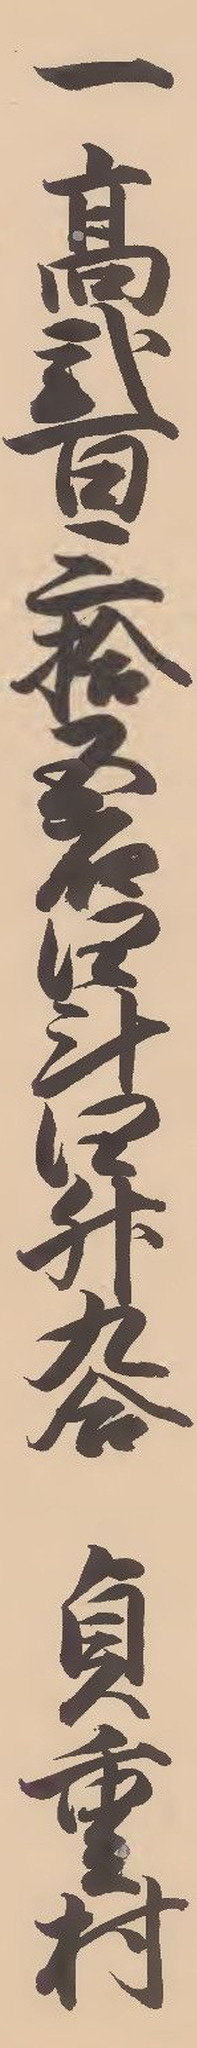一高弐百三拾五石四斗四升九合貞重村
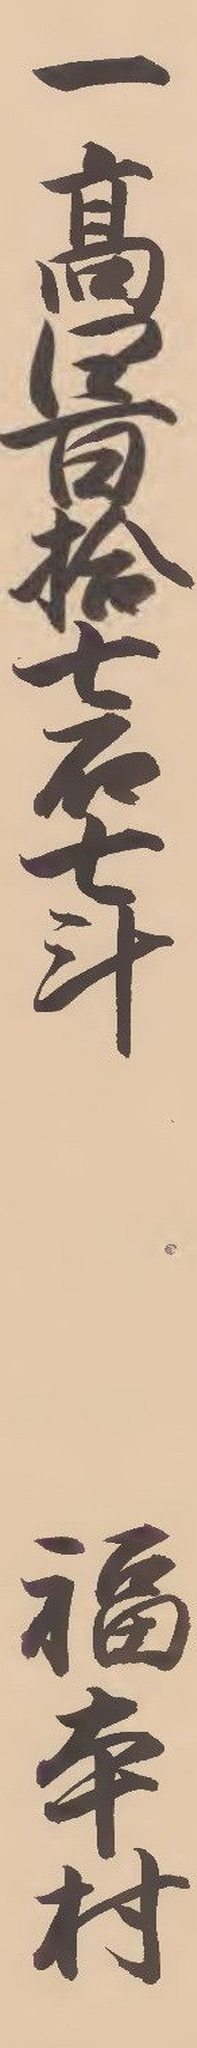一高四百拾七石七斗福本村

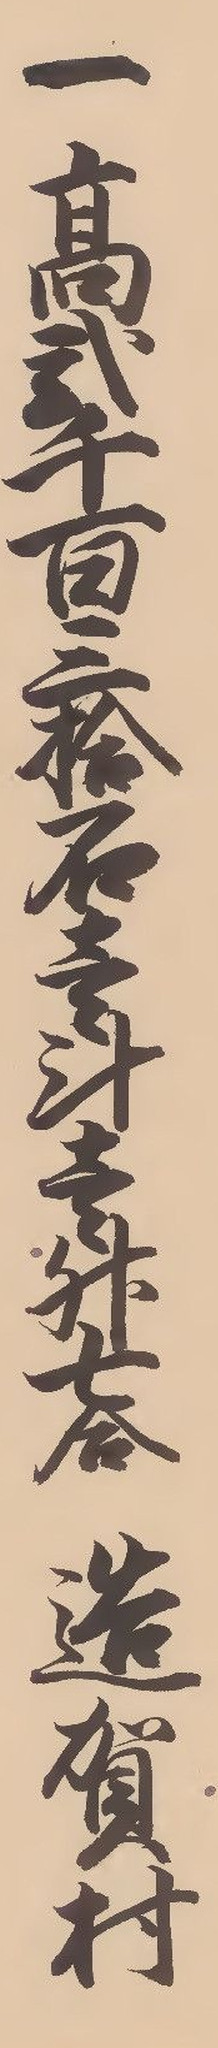一高弐千百三拾石壱斗壱升七合造賀村
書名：安芸国郷帳
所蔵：国立公文書館 National Archives of Japan
